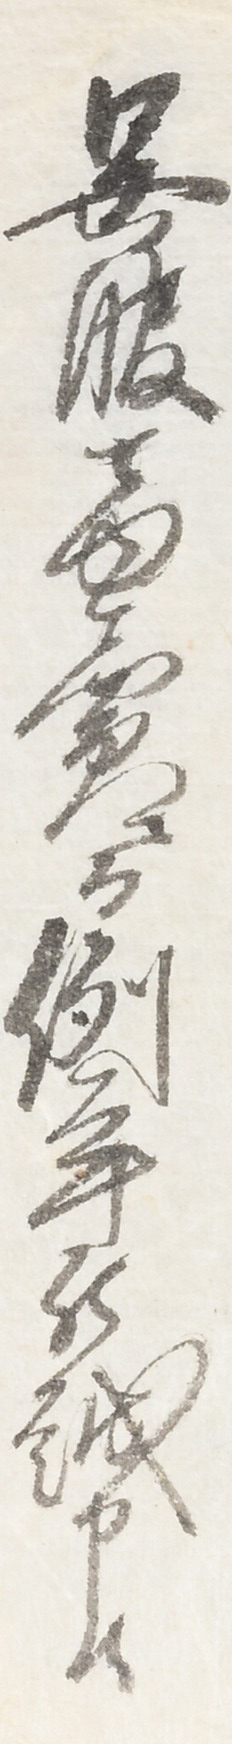呉服商売ニ而例年罷越申候
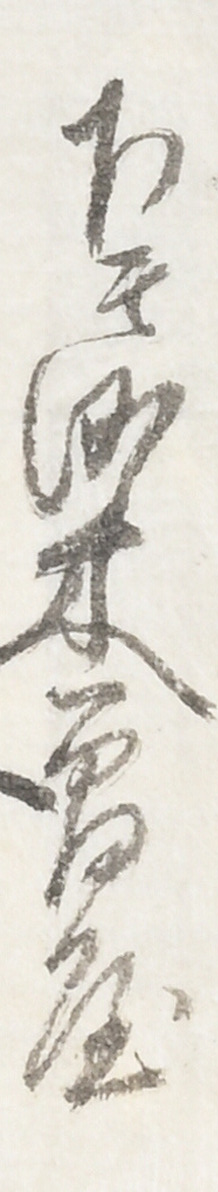下モ町木曽屋
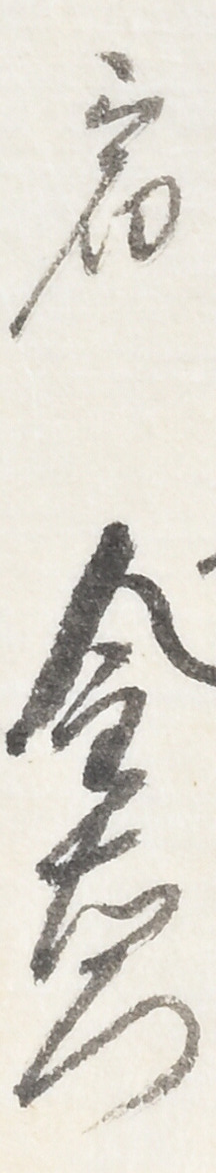宿金右衛門
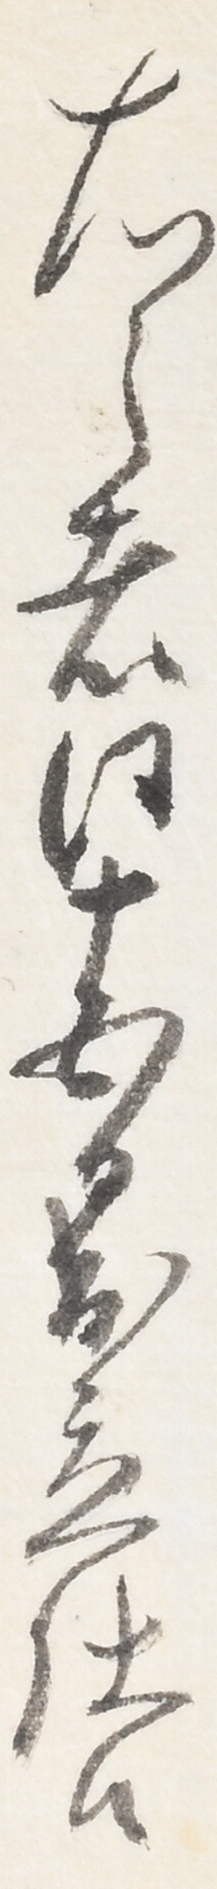右之者同十五日出立仕候
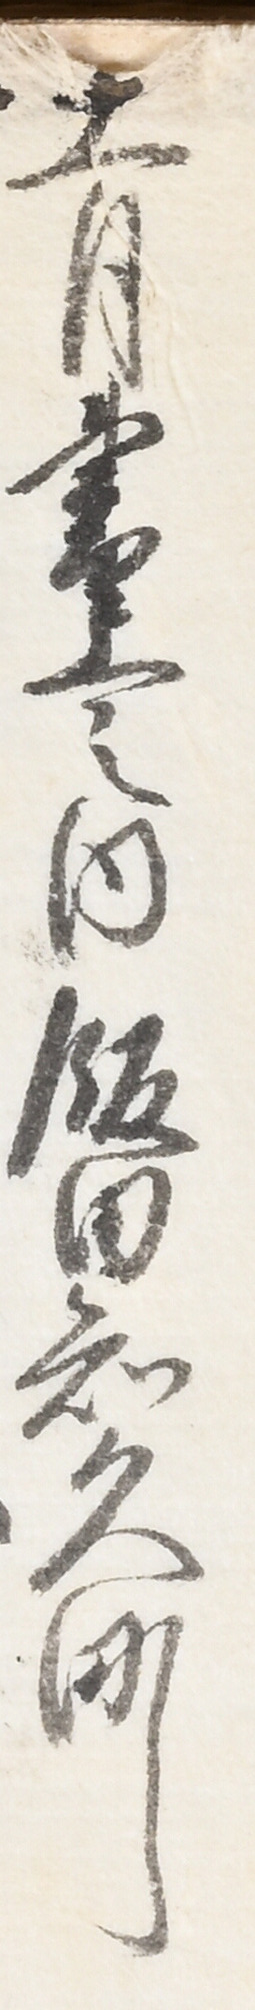十一月書上之内飯田知久町
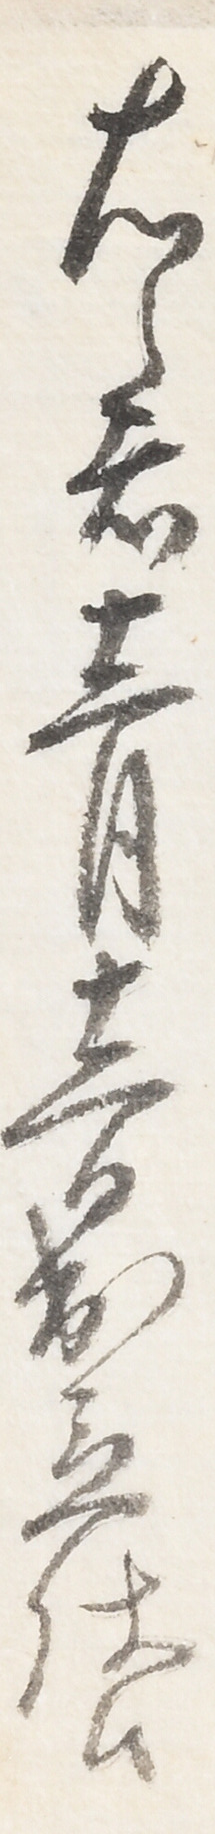右之者十二月十二日出立仕候
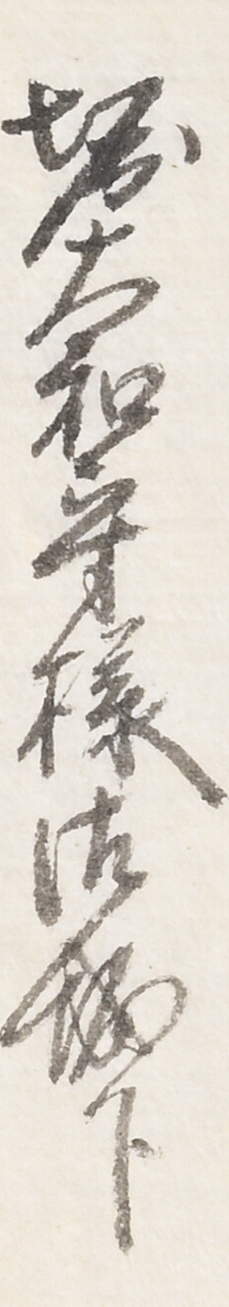堀大和守様御城下
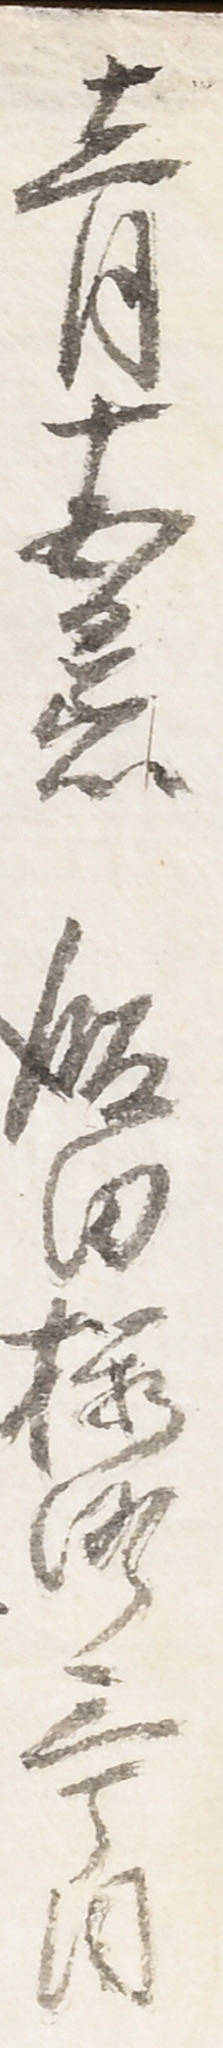十二月十五日着飯田桜町三丁目
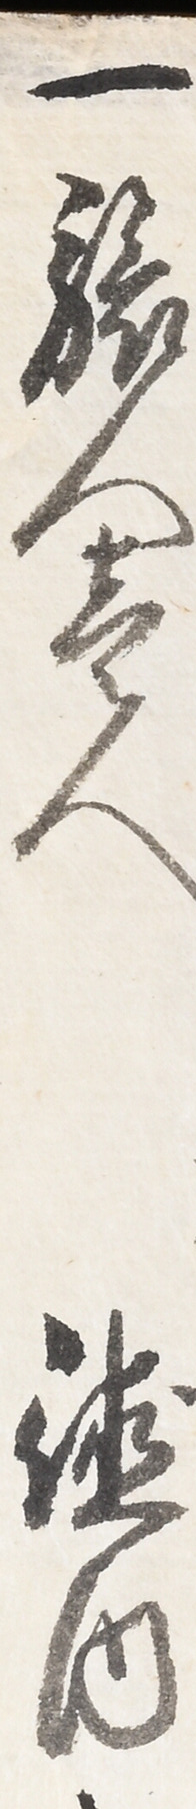一旅人壱人徳内・
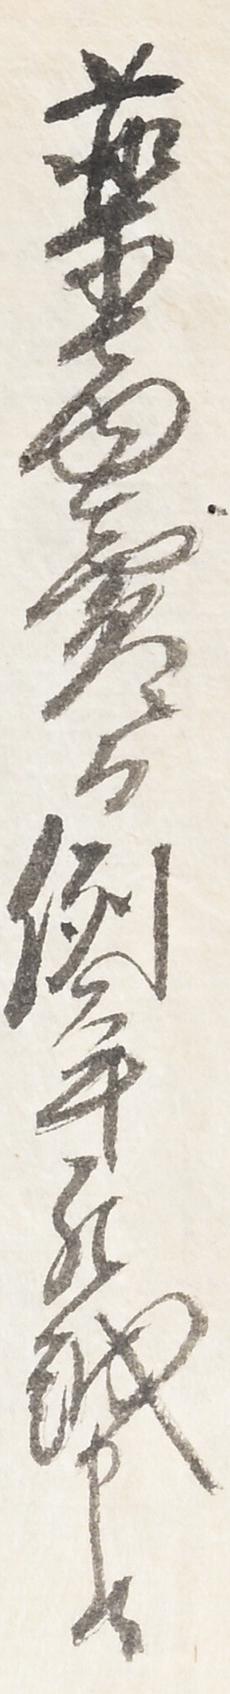薬商売ニ而例年罷越申候
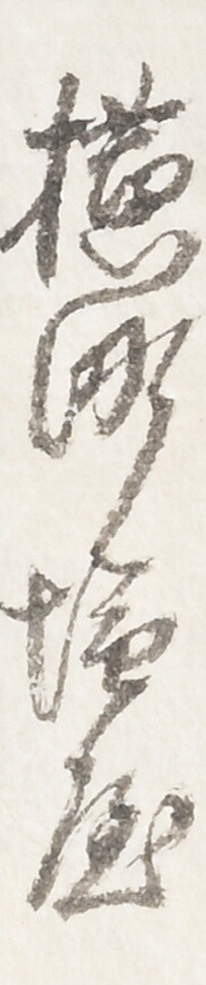横町塩屋
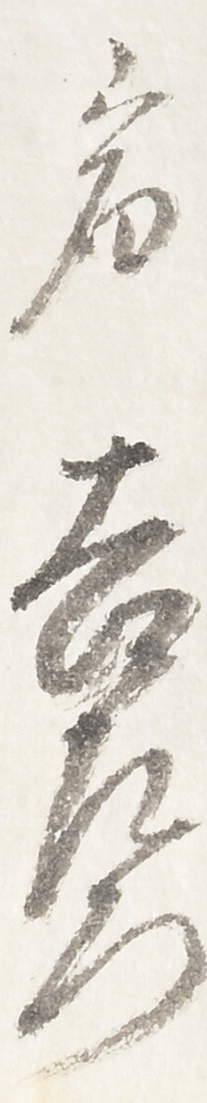宿吉左衛門
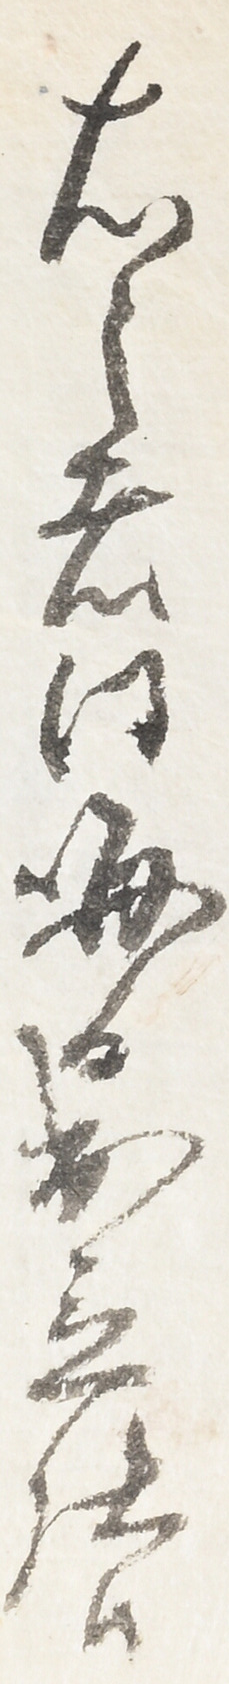右之者同晦日出立仕候
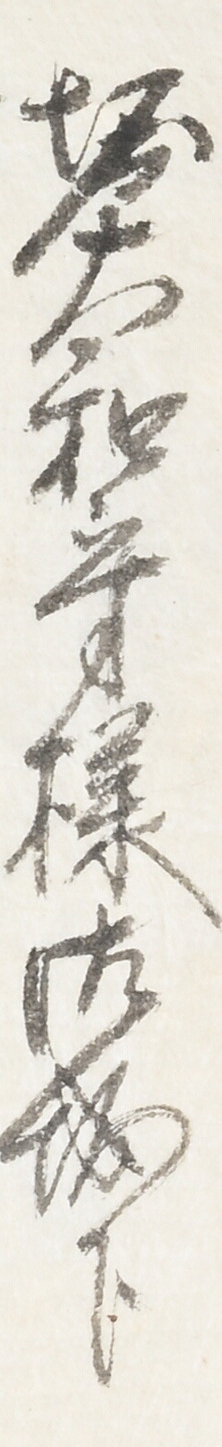堀大和守様御城下
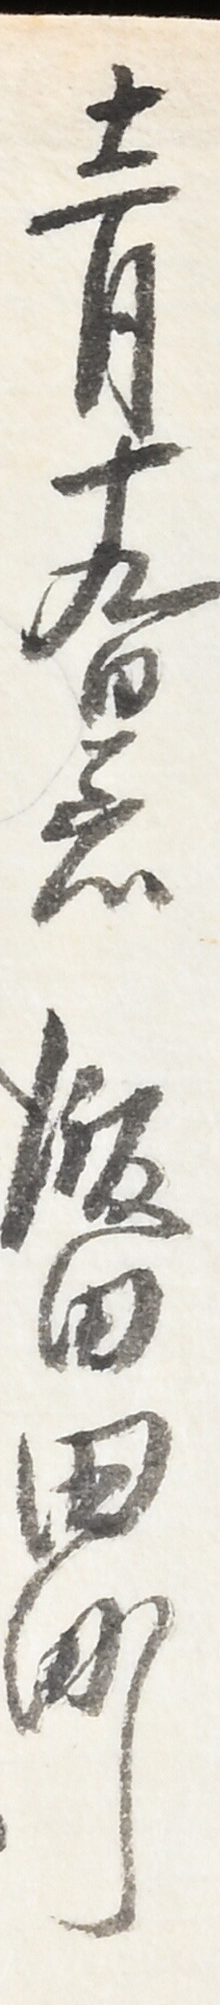十二月十九日着飯田田町
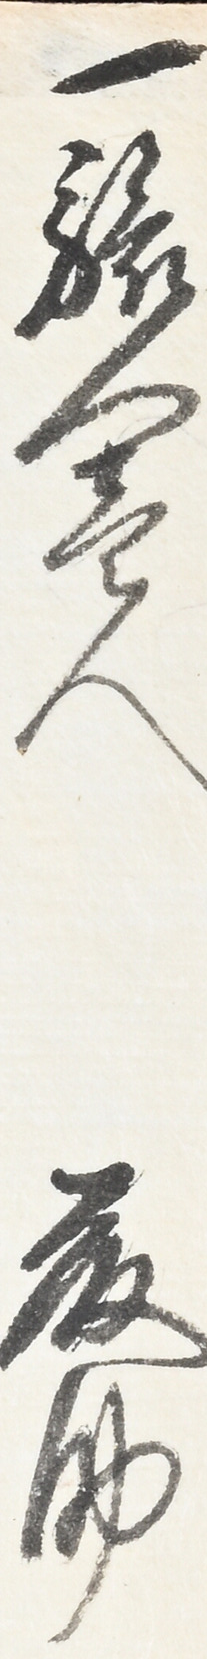一旅人壱人藤助
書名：旅人泊控帳
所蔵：伊那市立高遠町図書館・合同会社AMANE
